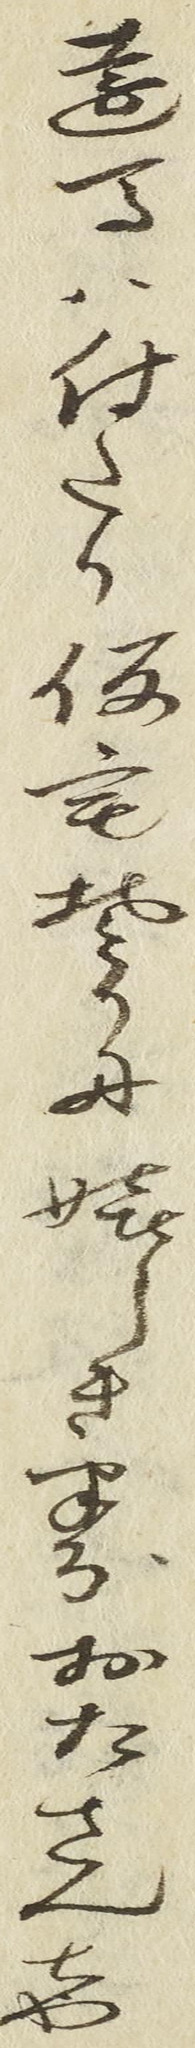遠馬ハ付たり仮宅そりに嬉しさ半分おたさんちや
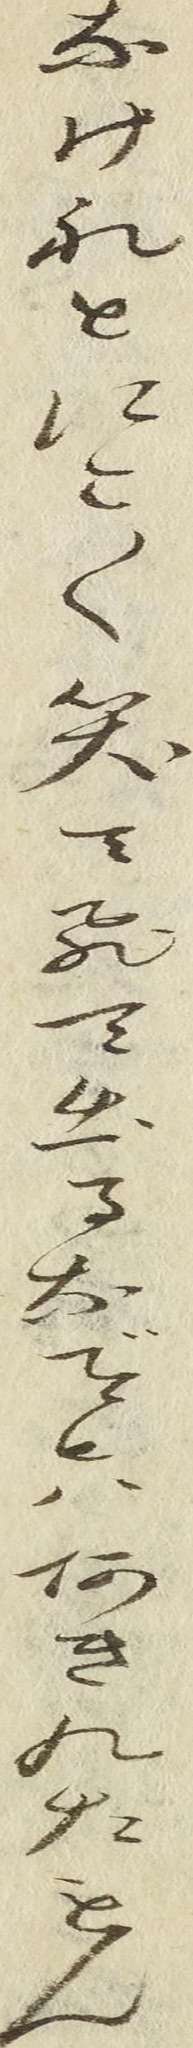なけれとにこ〳〵笑て飛て出るなでとハあきれたもん
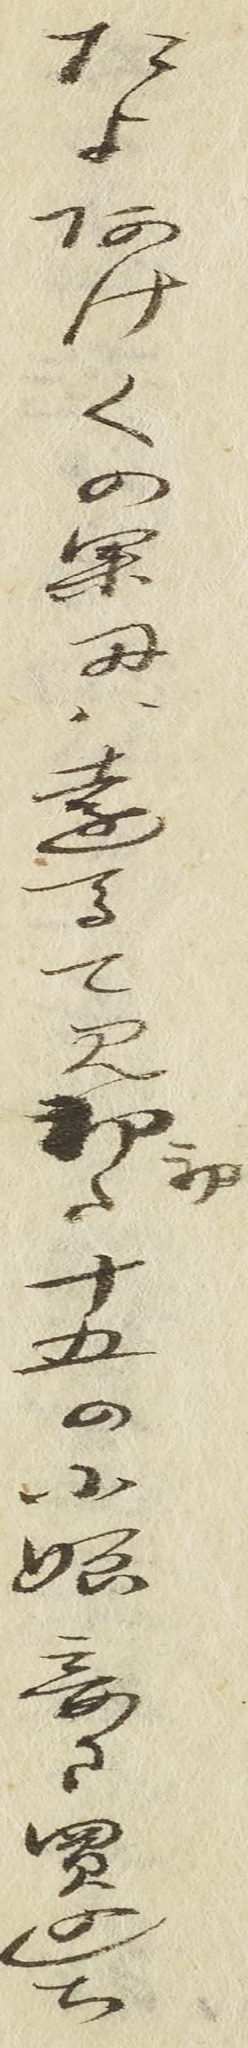たよあけくの果にハ遠馬て見初た十五の小娘妾に買込ち
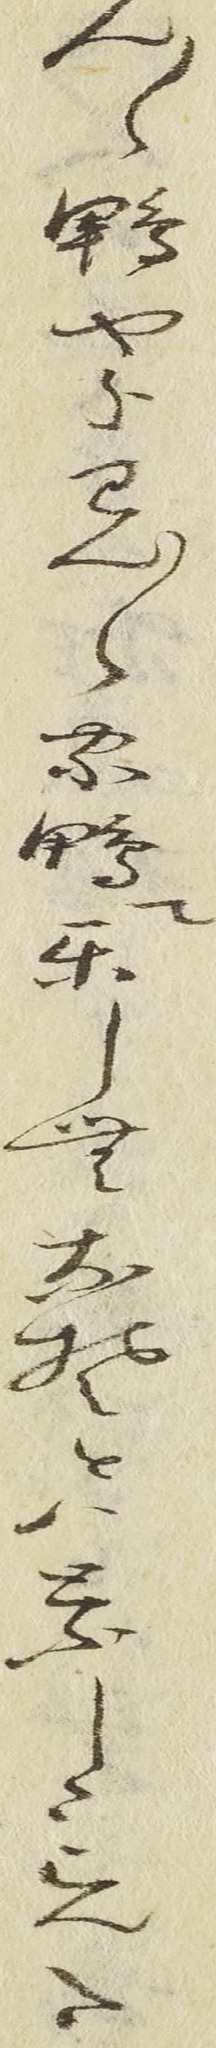ん〳〵鴨やらわん〳〵や鴨て楽しむなそとハとふしたこんた
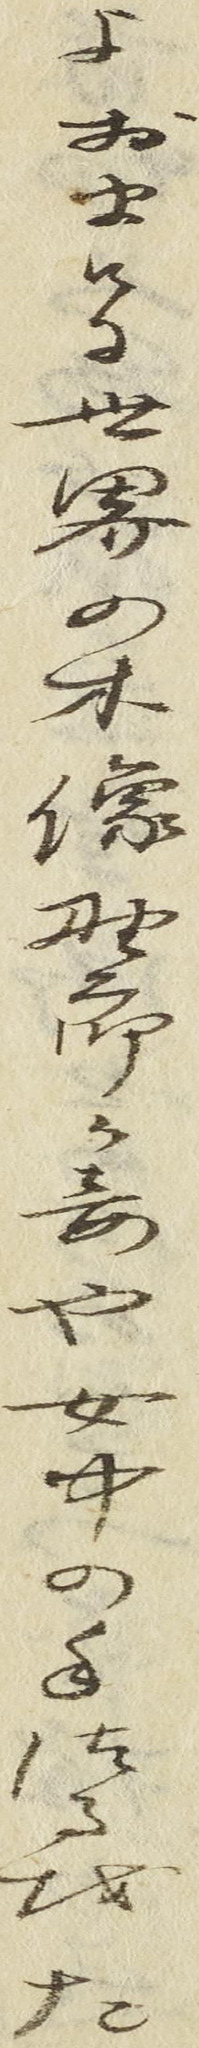よおまけに世界の木像野郎か妾や女中のてつるをた
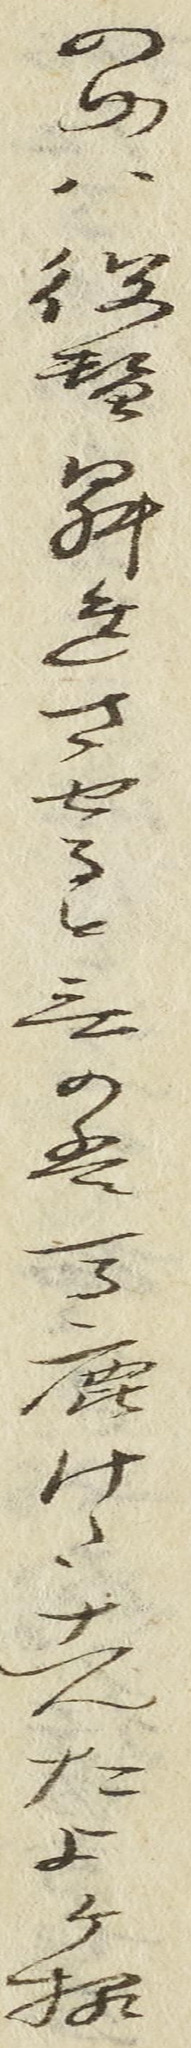のむハ役替昇れさせると云のは馬鹿けたこんたよヶ様
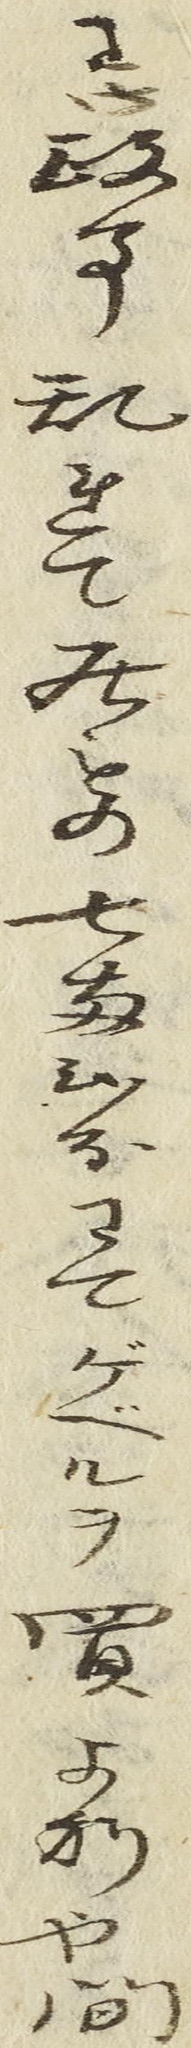に政事乱れて居もの七両弐分にてゲベルヲ買よりや間
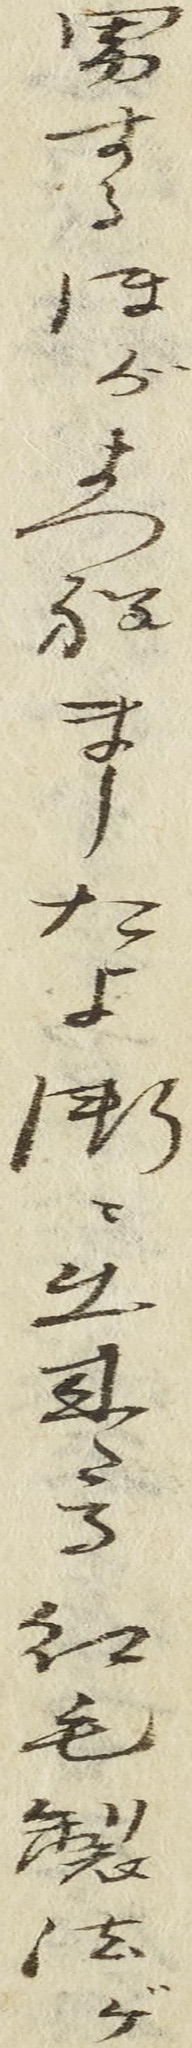男するほがよつ程ましたよ漸々出来たる紅毛製法ゲ
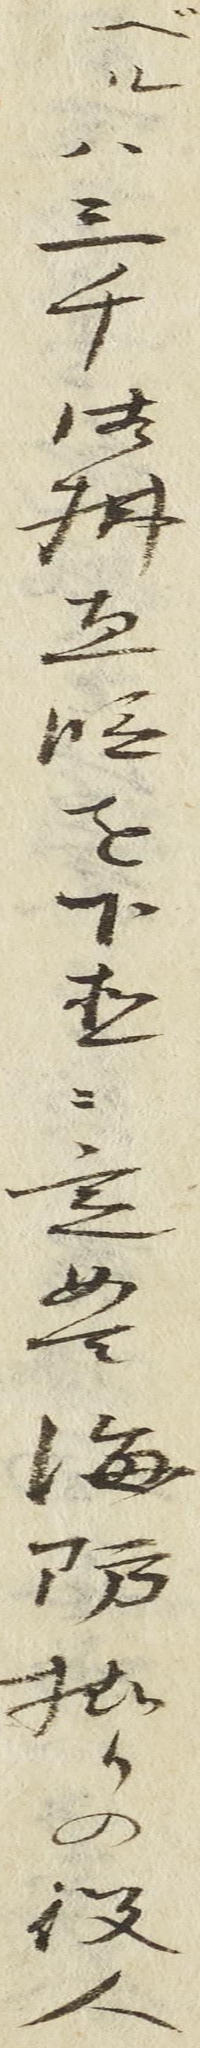ベルハ三千御払直段を下置二定めて海防係りの役人
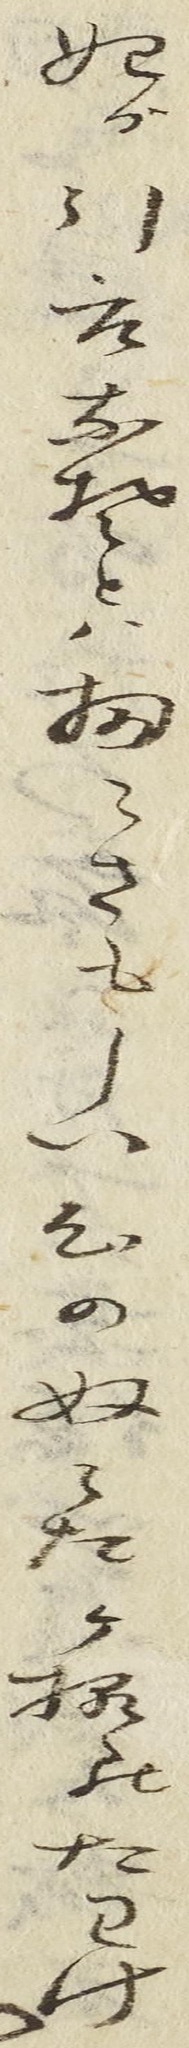めが引取なそとハ扨々さもしい心の奴らたヶ様のたわけの
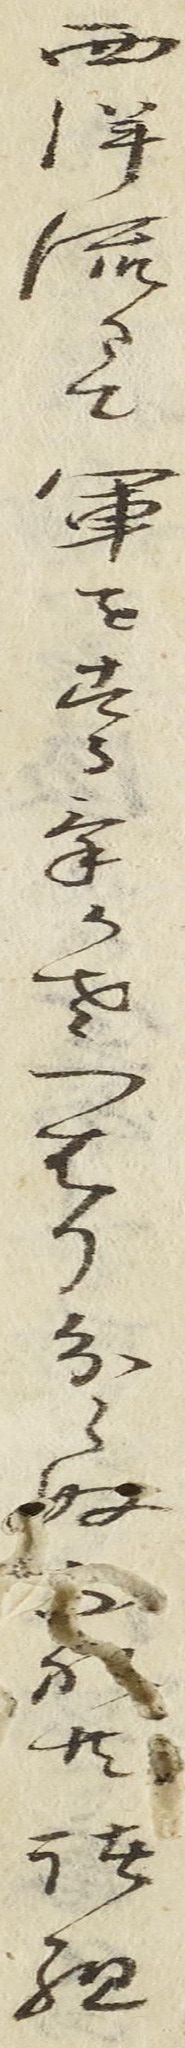西洋流たて軍をする気かさつはり分らぬけれ共諸組
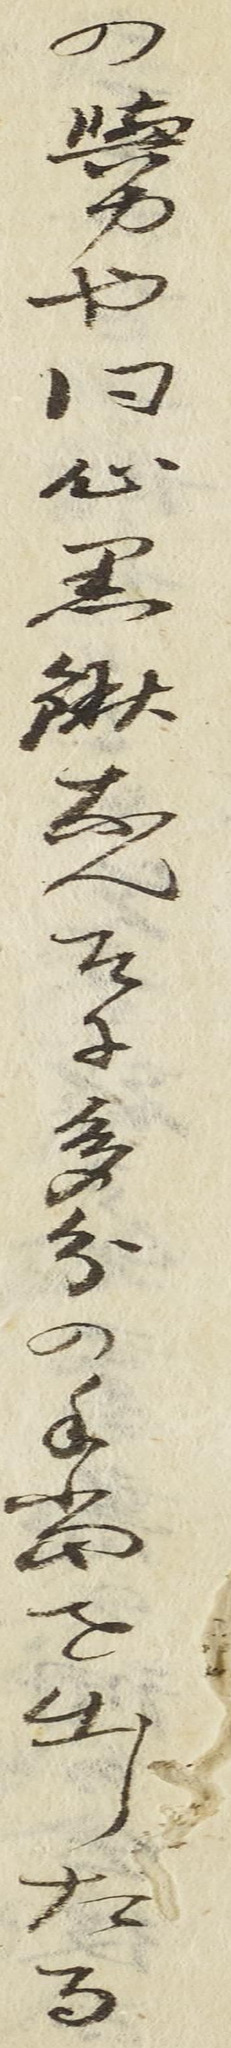の与力や同心黑鍬なんそに多分の手当を出したる
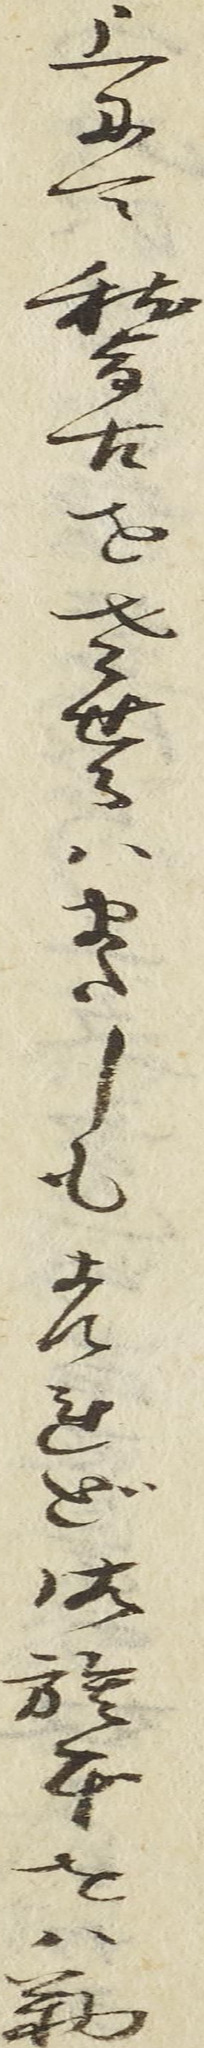上にて稽古をさせるハまたしもよけれど御旗本をハ勤
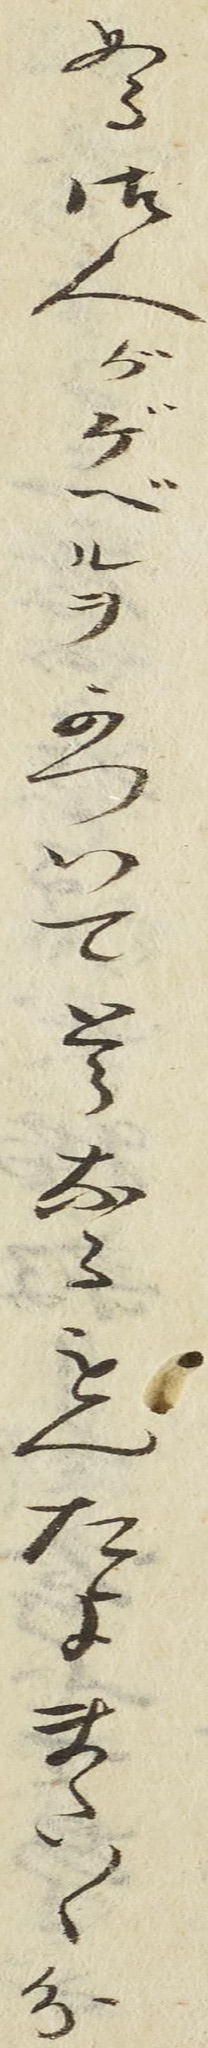める御人がゲベルヲかついてとうなるもんたよまた〳〵分
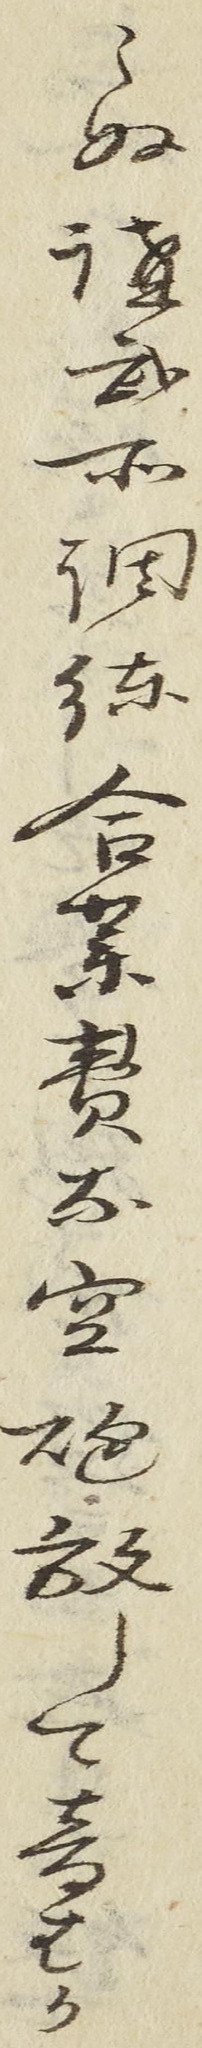らぬ講武所調練合薬費な空砲放して音はか
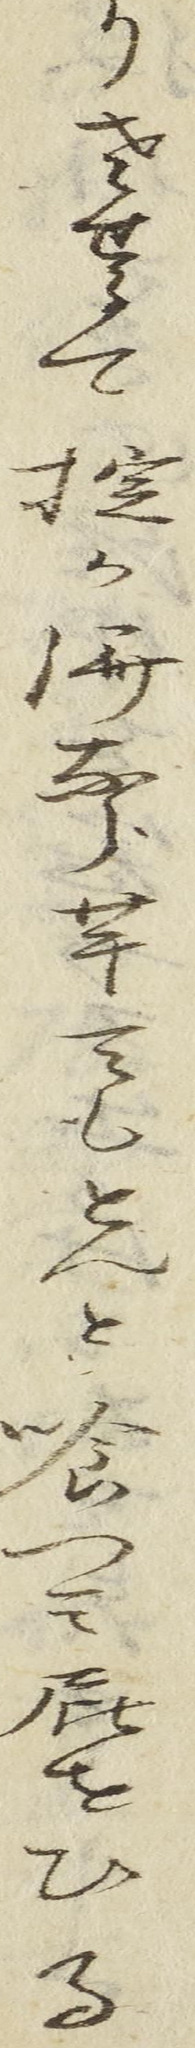りさせて掟か済なら芋てもとんと喰つて屁をひる
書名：世説ヤンレフシ写、駿州田中城地震ニ付内外破損御届書、豫州大洲城地震ニ付内外破損御届書・封廻状
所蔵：東京大学地震研究所図書室 Earthquake Research Institute Library, The University of Tokyo, JAPAN
